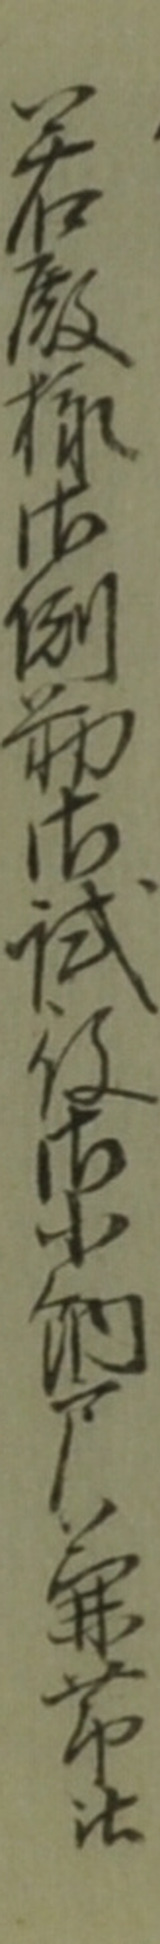若殿様御側勤御試役御小納戸兼帯被
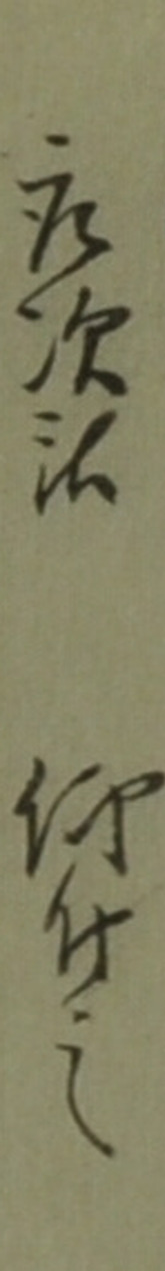取次被仰付之
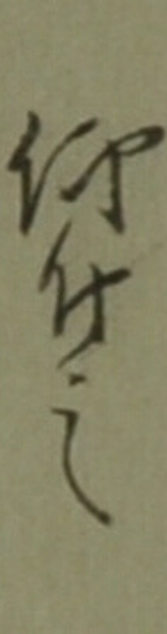仰付之
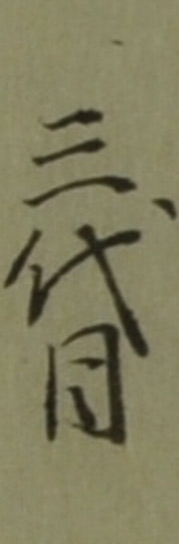三代目
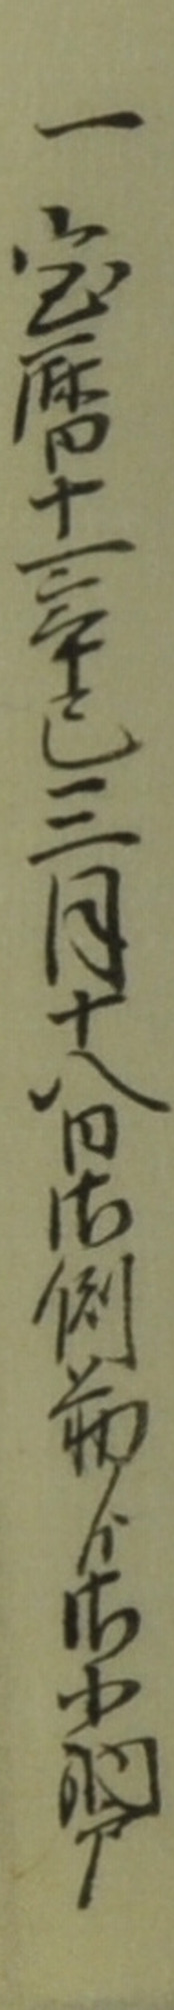一宝暦十一辛巳三月十八日御側勤ゟ御小納戸
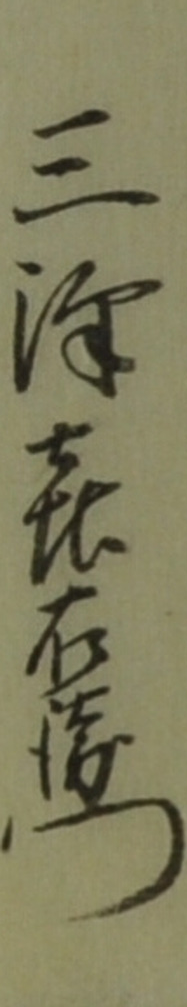三沢喜右衛門

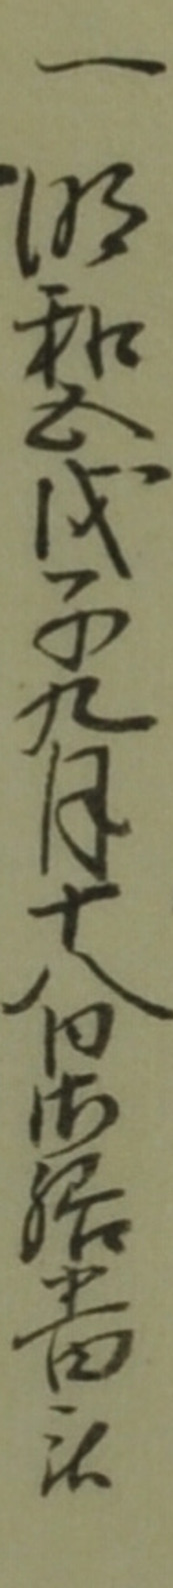一明和五戊子九月十八日御膳番被
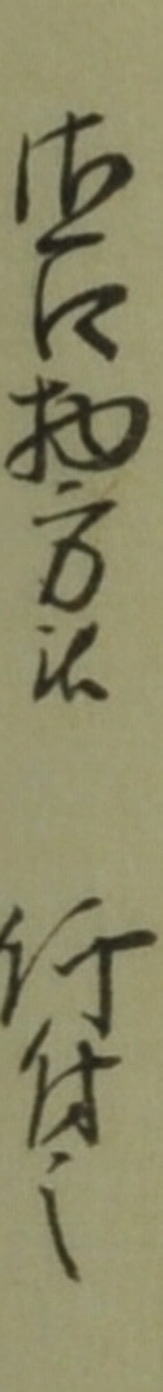御召物方被仰付之
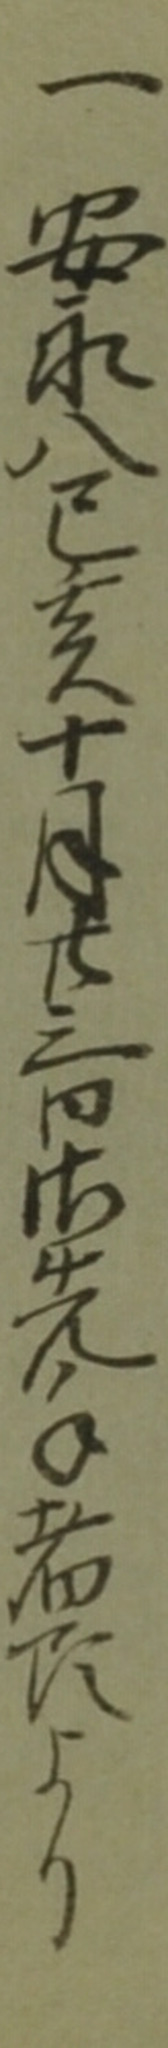一安永八己亥十月廿三日御先手者頭より
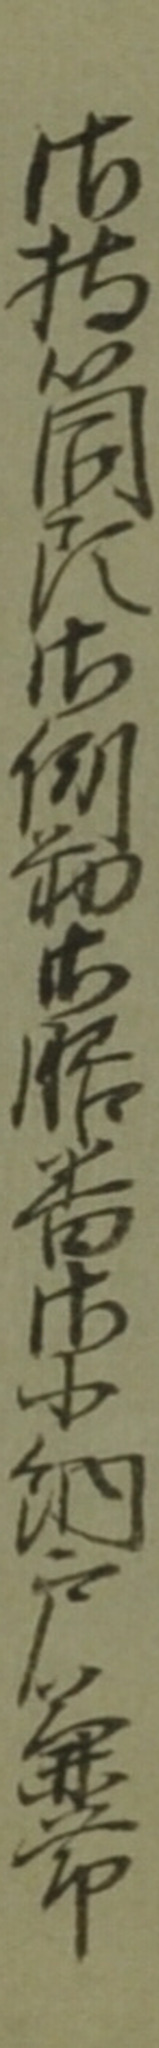御持筒頭御側勤御膳番御小納戸兼帯
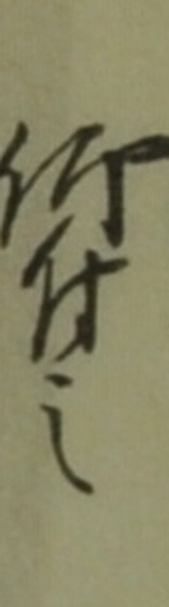仰付之
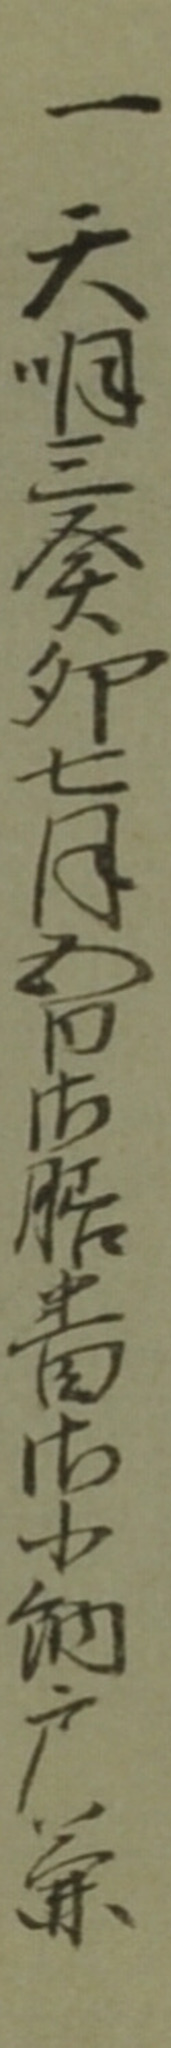一天明三癸卯七月五日御膳番御小納戸兼
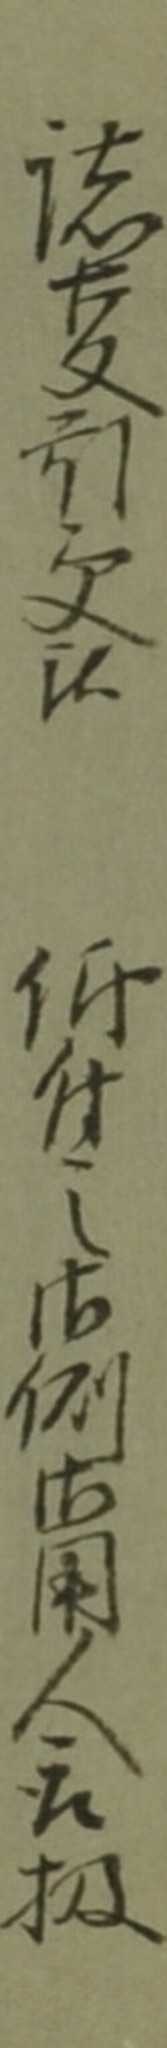諸事引受被仰付之御側御用人取扱
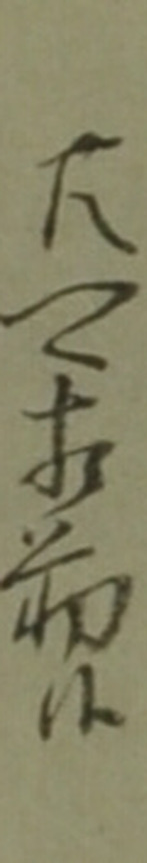共方相勤候
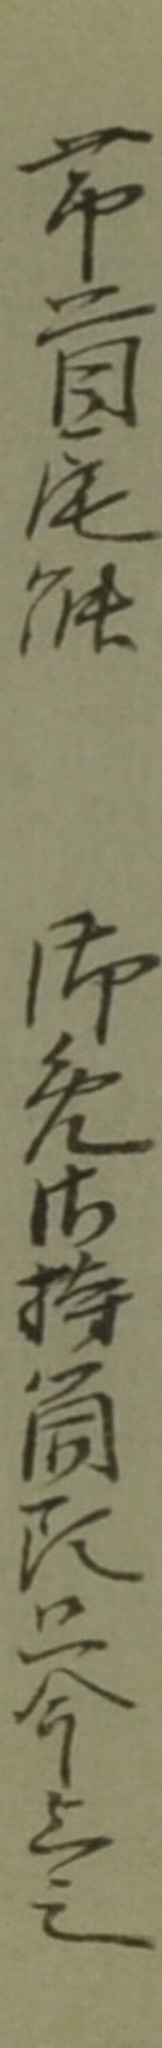帯首尾能御免御持筒頭只今迄之
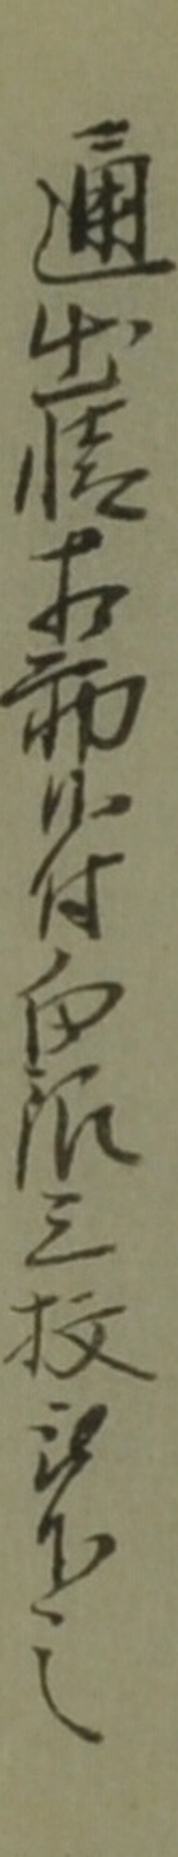通出情相勤候付白銀三枚被下之
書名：諸御役代々録（四）
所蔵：伊那市立高遠町図書館・合同会社AMANE
